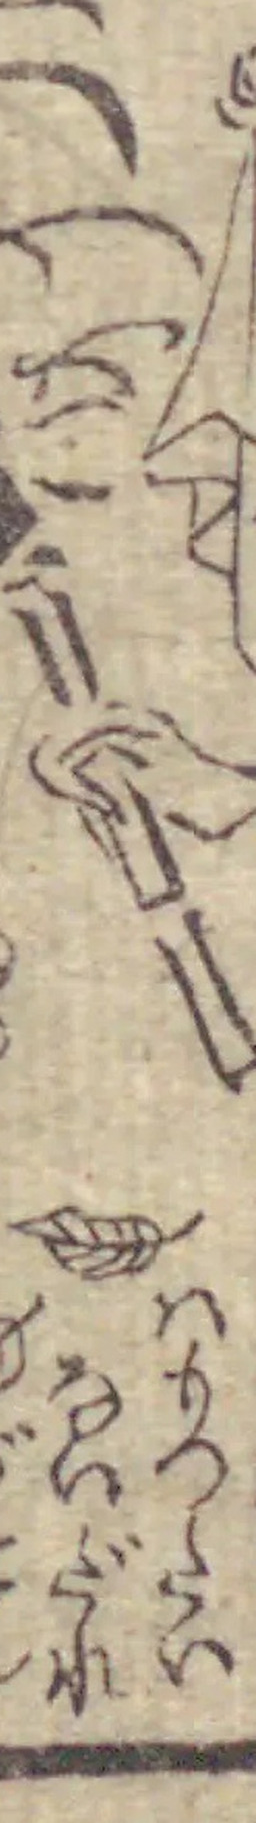ないだれ
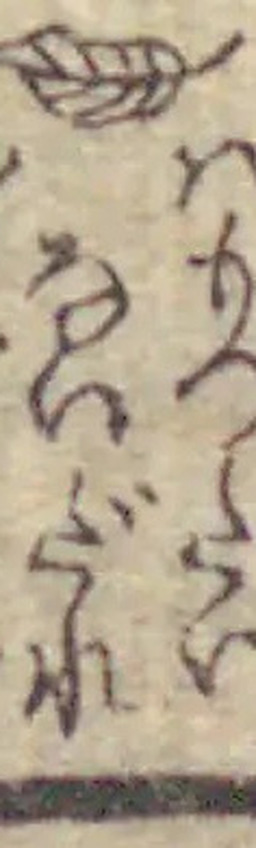ないだれ
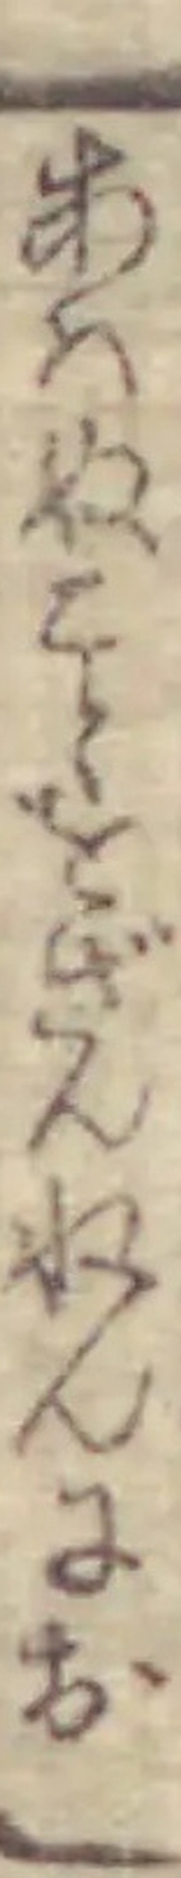あはぬことをざんねんにお
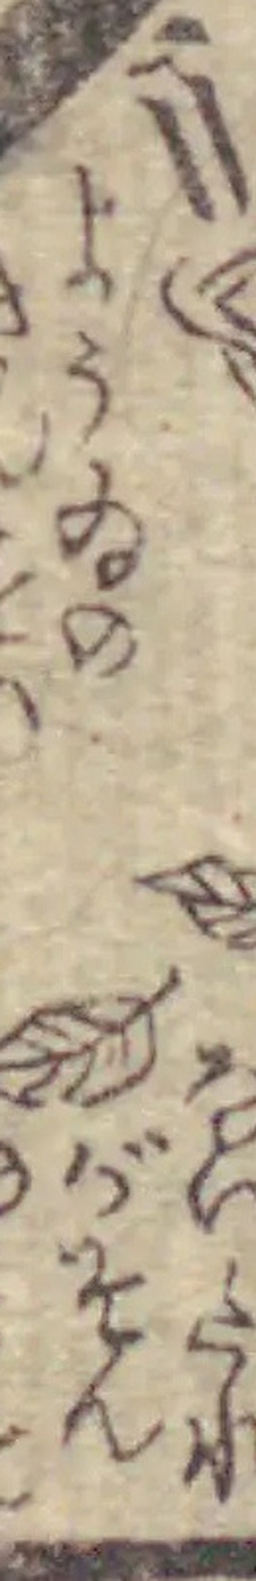ようゐの
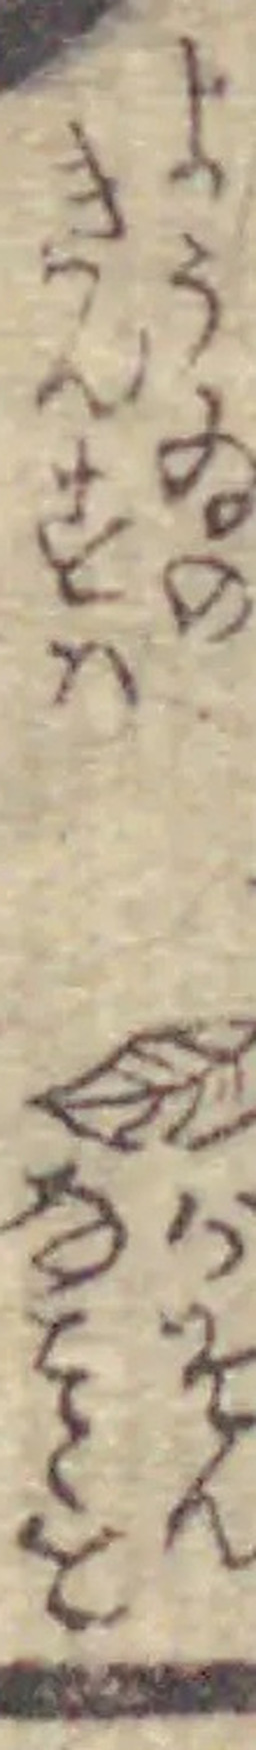きんすは
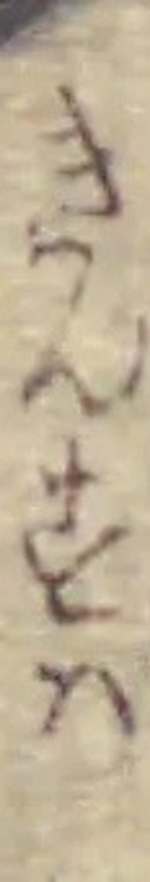きんすは
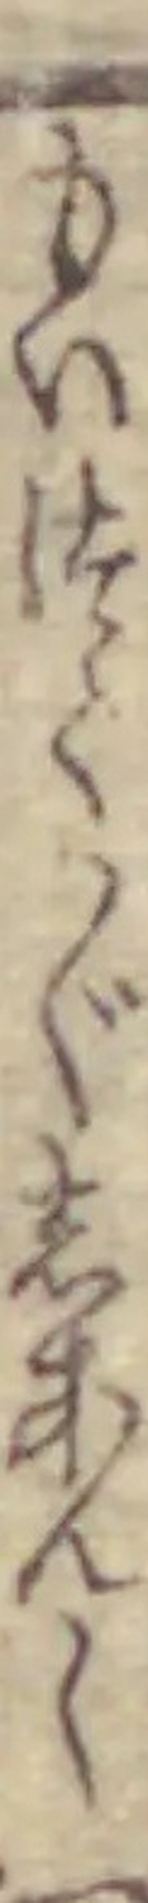もいつく〴〵しあんし
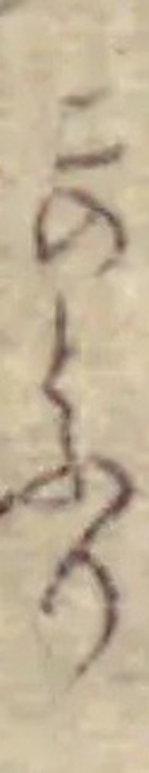このとふり
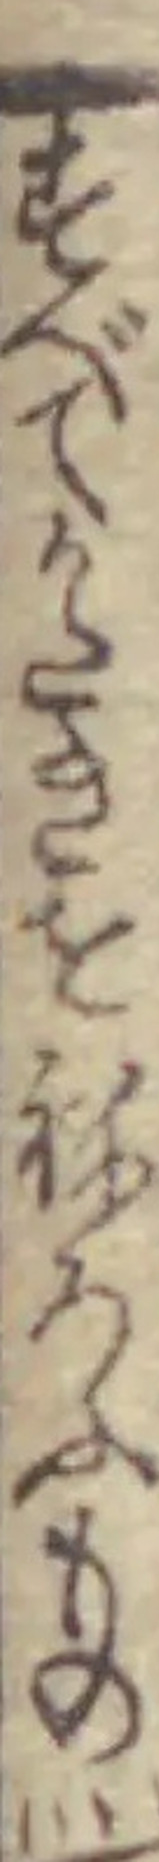すべてかたきをねろふもの
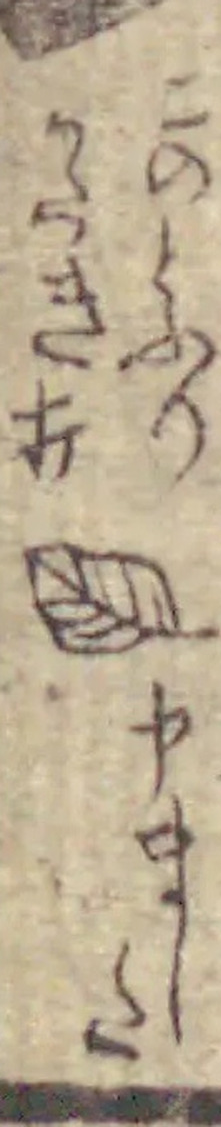かたき打
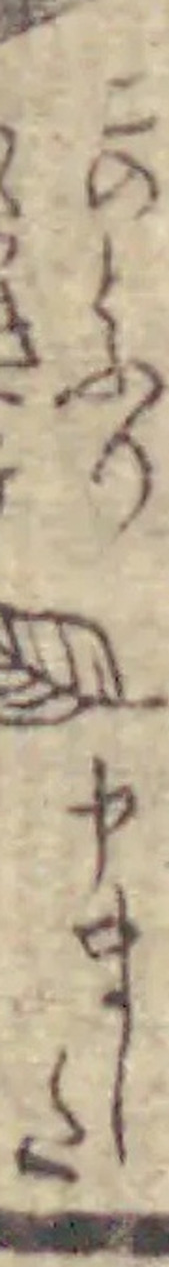このとふり
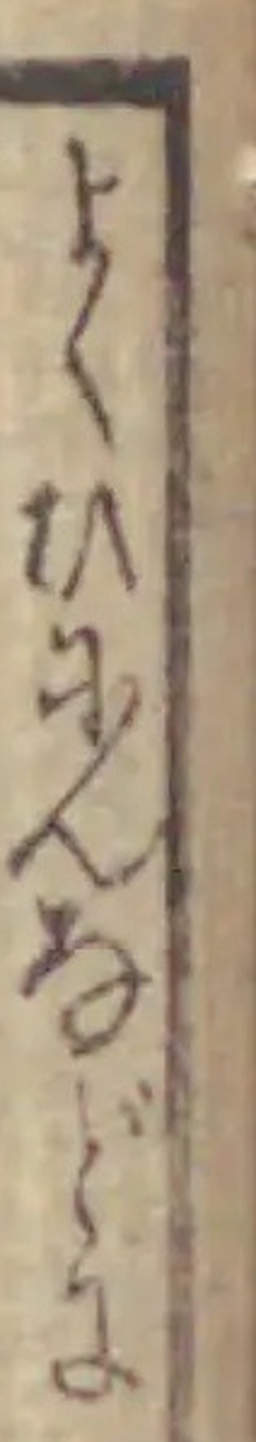よくひにんなどに
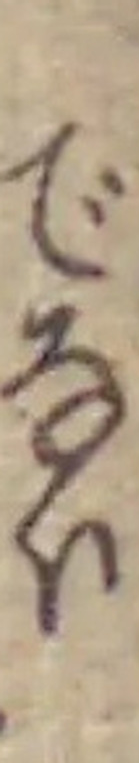でない
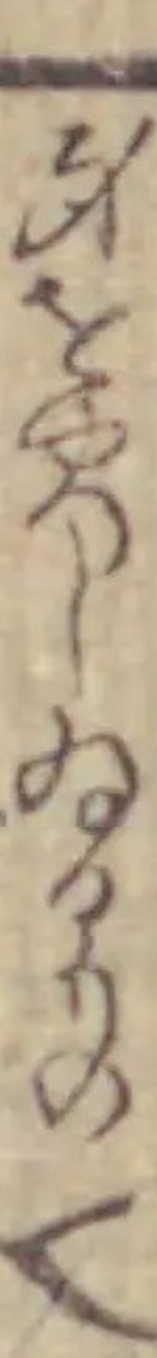身をやつしゐるもの
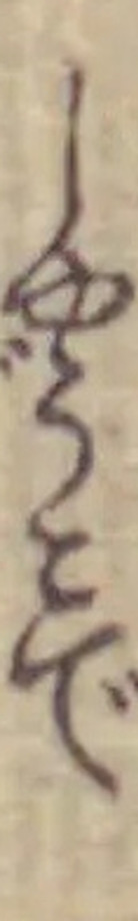しやうこで
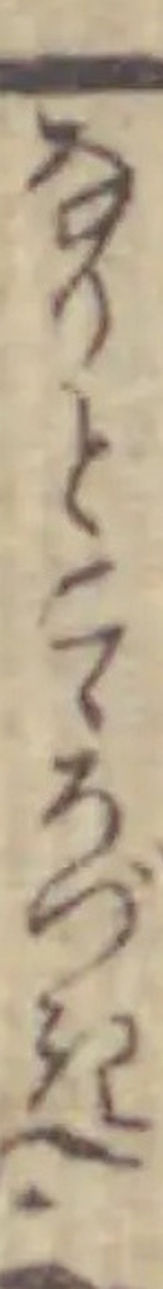なりとこゝろづき
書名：化物敵討 2巻
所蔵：国立国会図書館 National Diet Library, JAPAN
